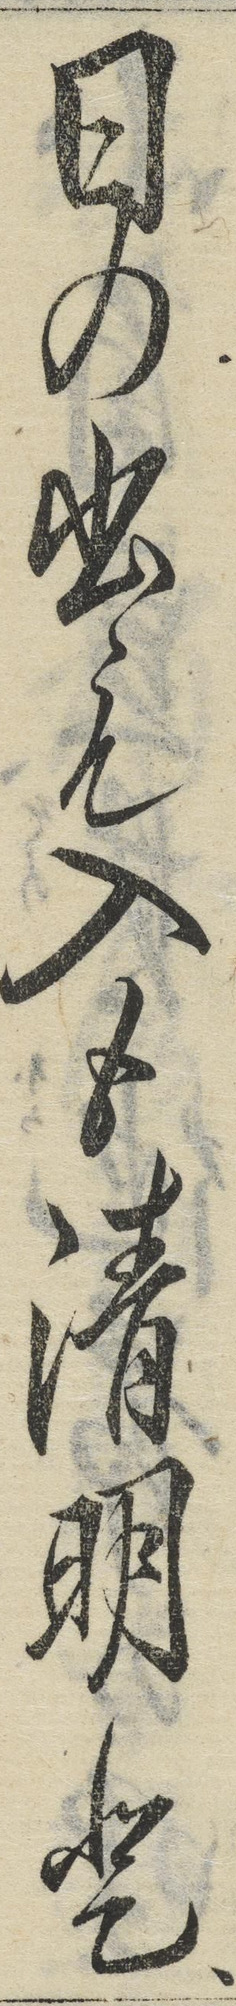日の出も入も清明と、
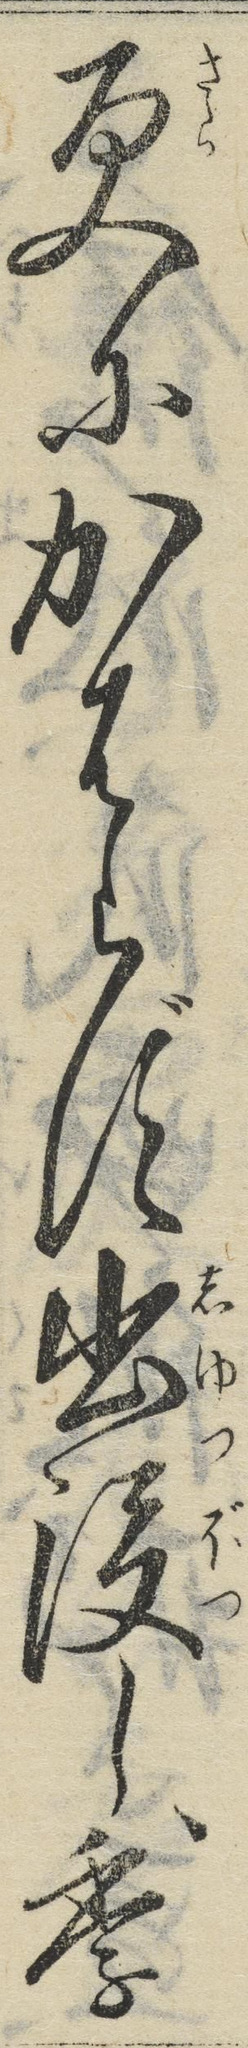更にかはらず出没し、季
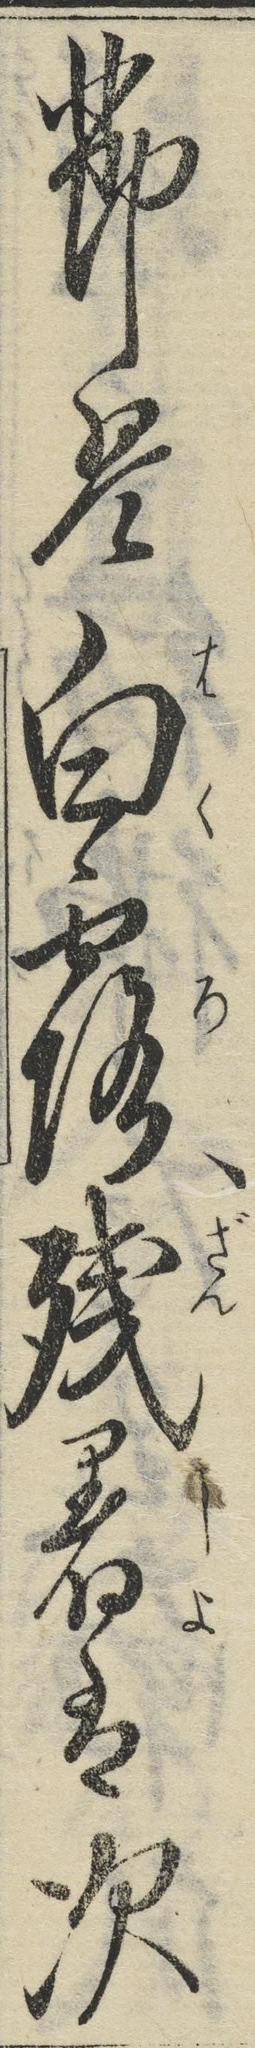節は白露、残暑は次
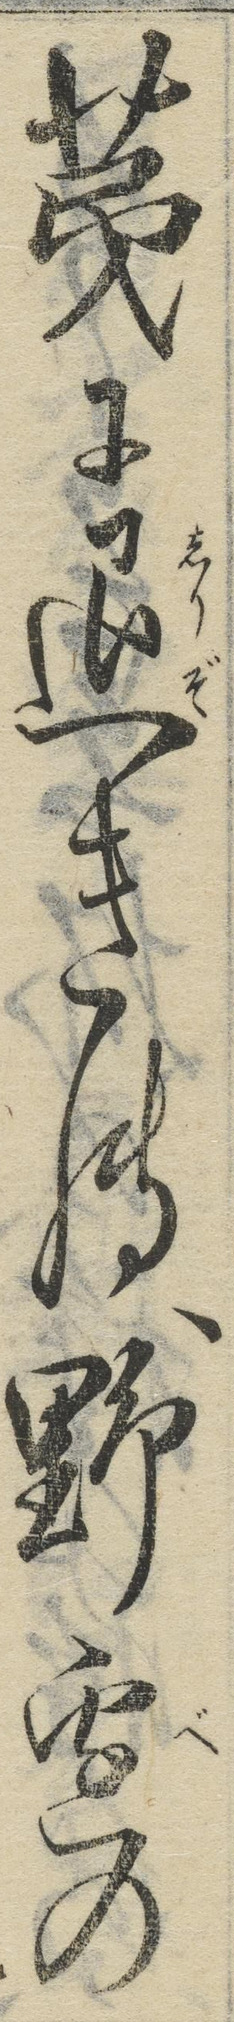第に退きて、野辺の
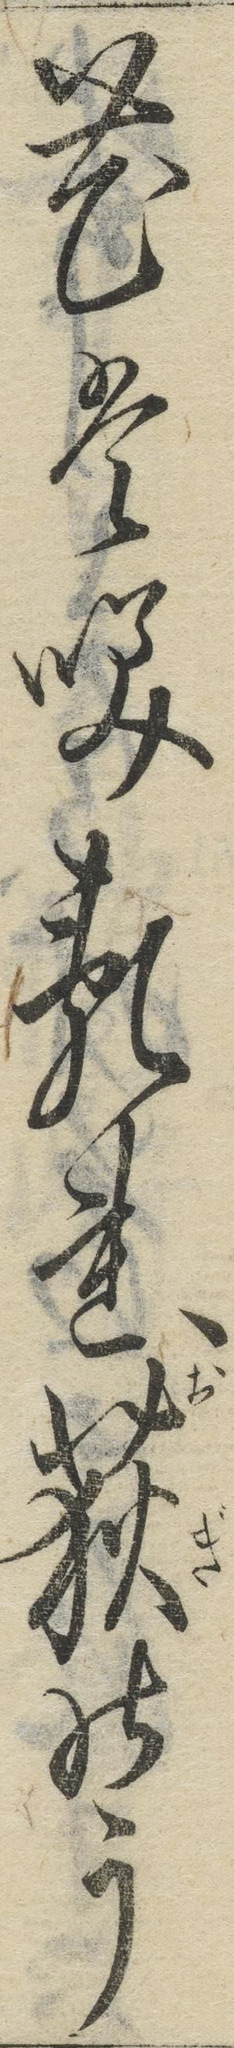花は咲乱れ、荻のう
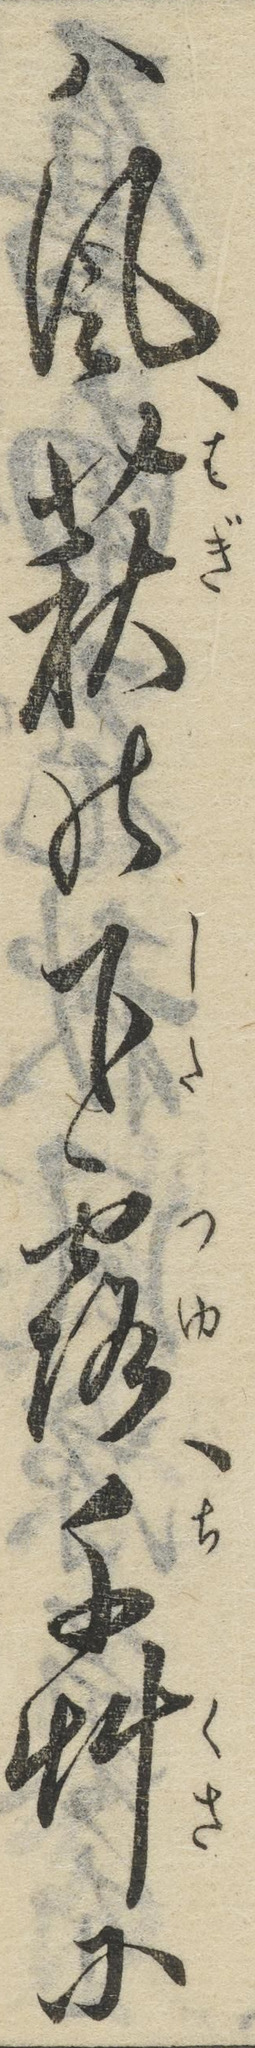は風、萩の下露、千草に
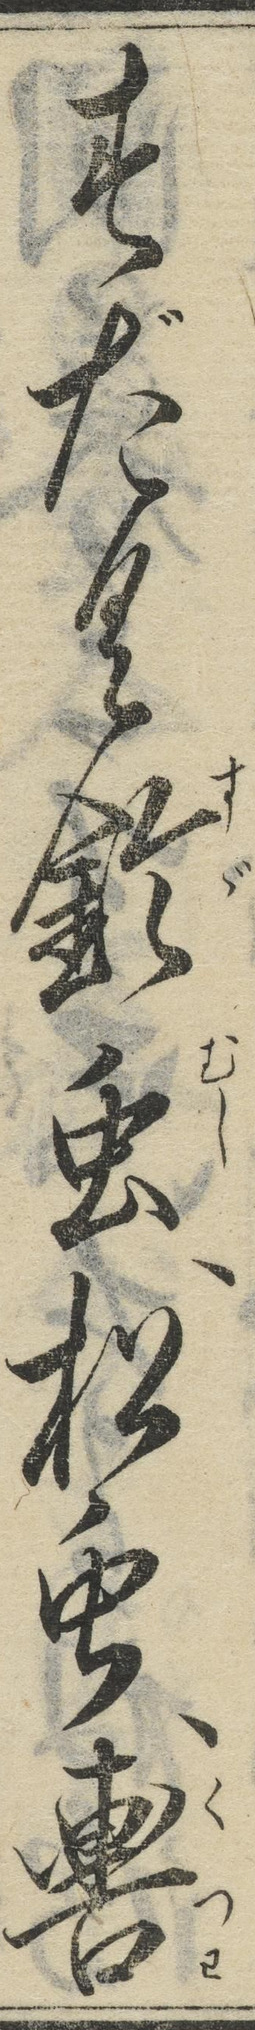すだく鈴虫、松虫、轡
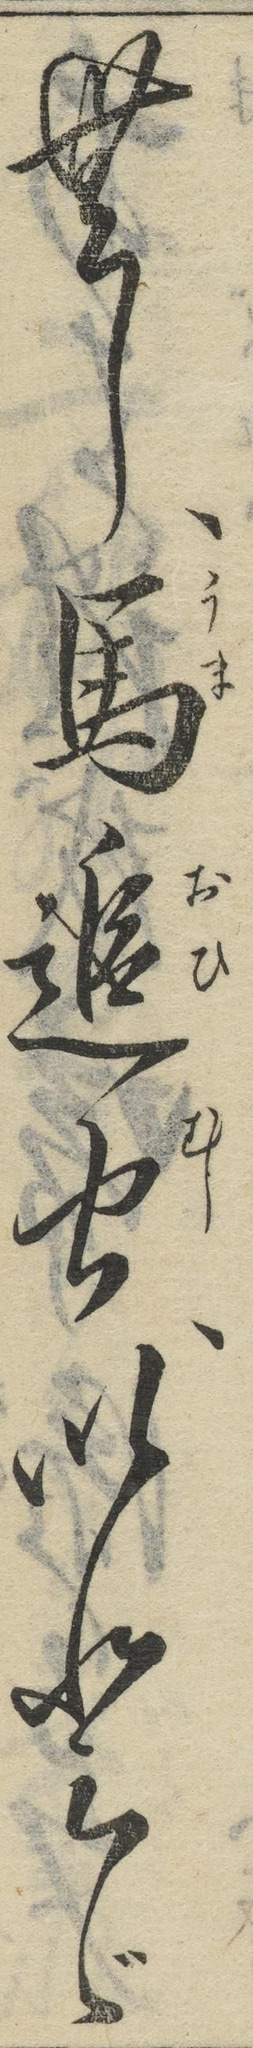むし、馬追虫、いとゞ

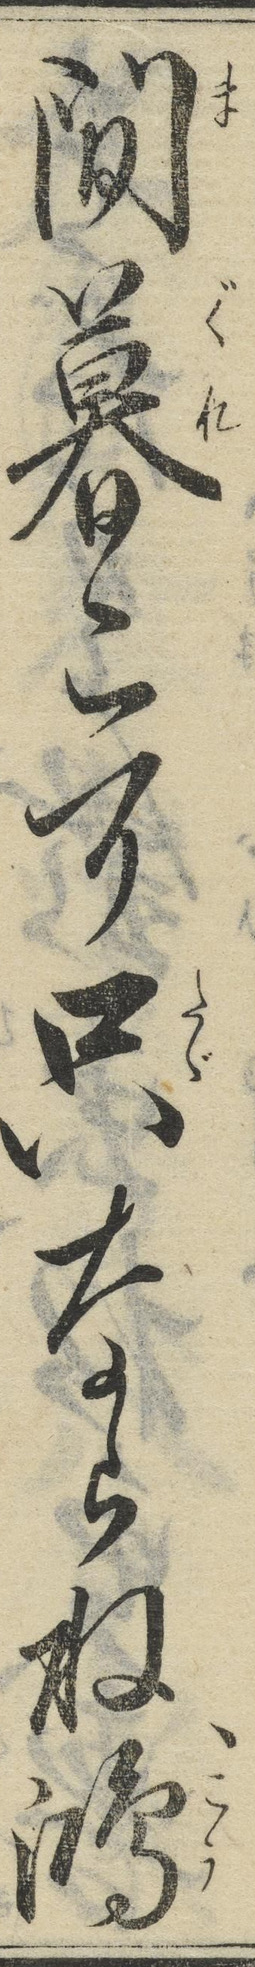間暮こそ只ならね、鴻
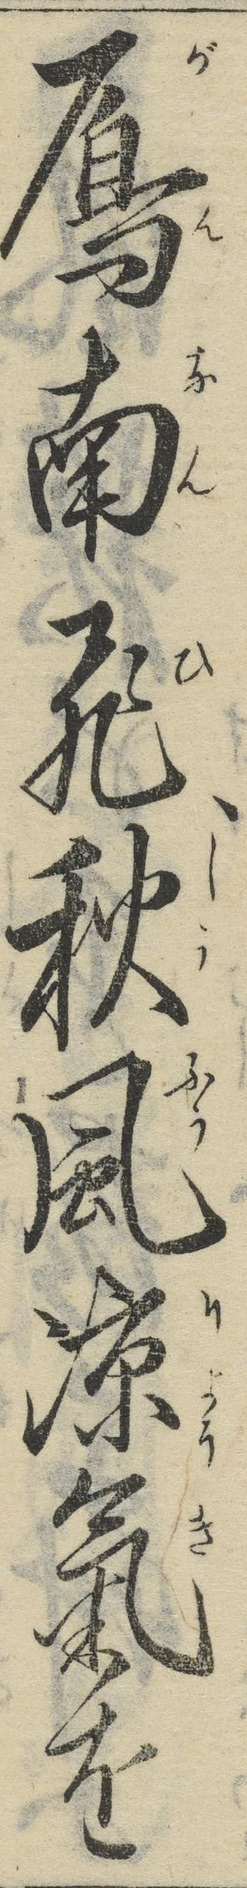雁南飛、秋風涼気を
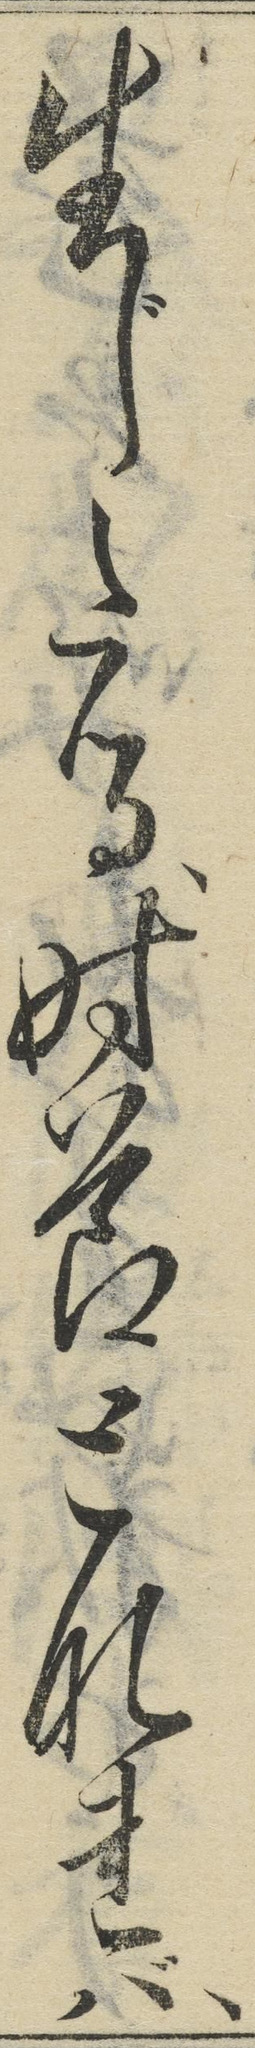生じたる、時節となれば、
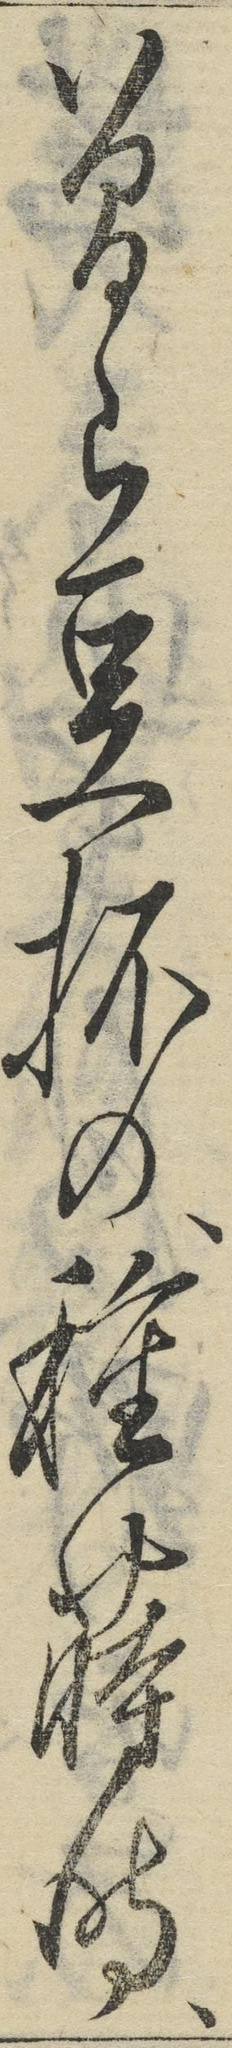そら豆抔の、種蒔時、
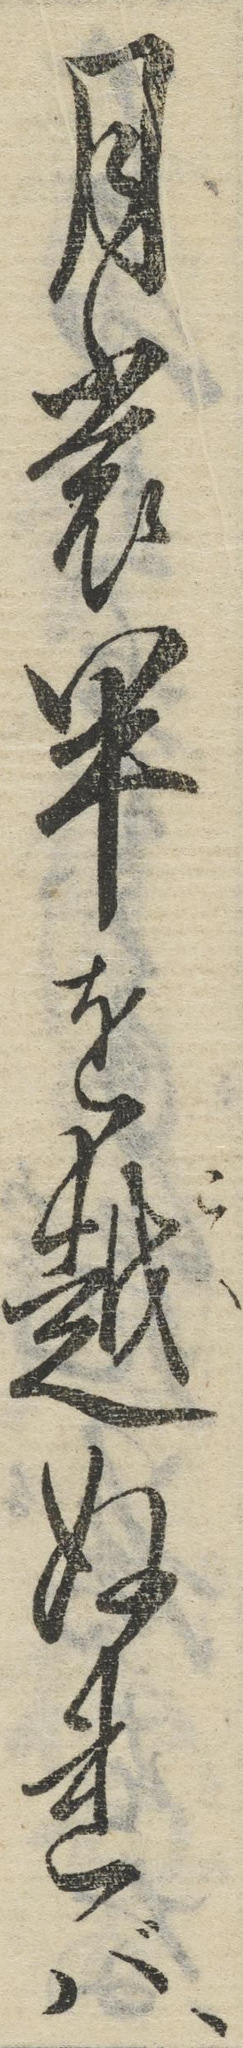月も半を越ぬれば、
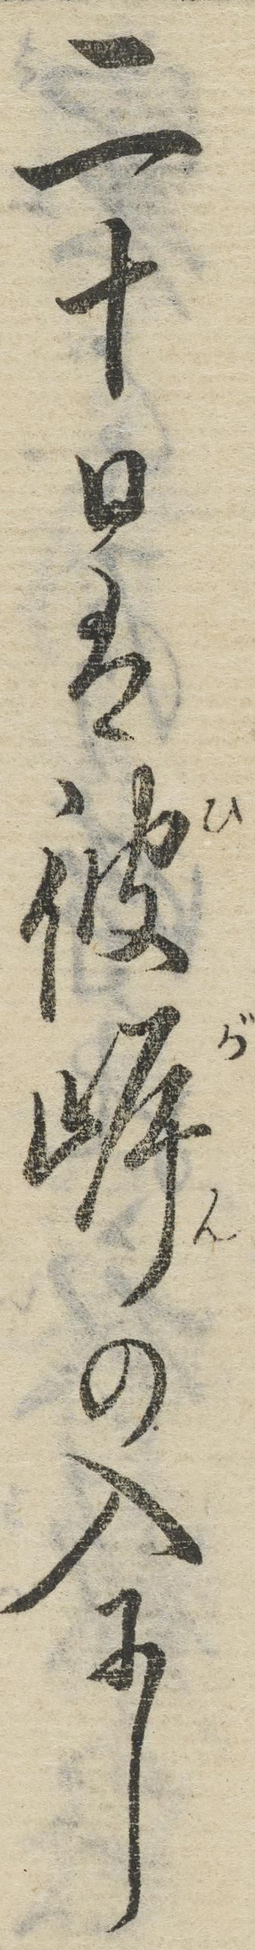二十日は彼岸の入にし
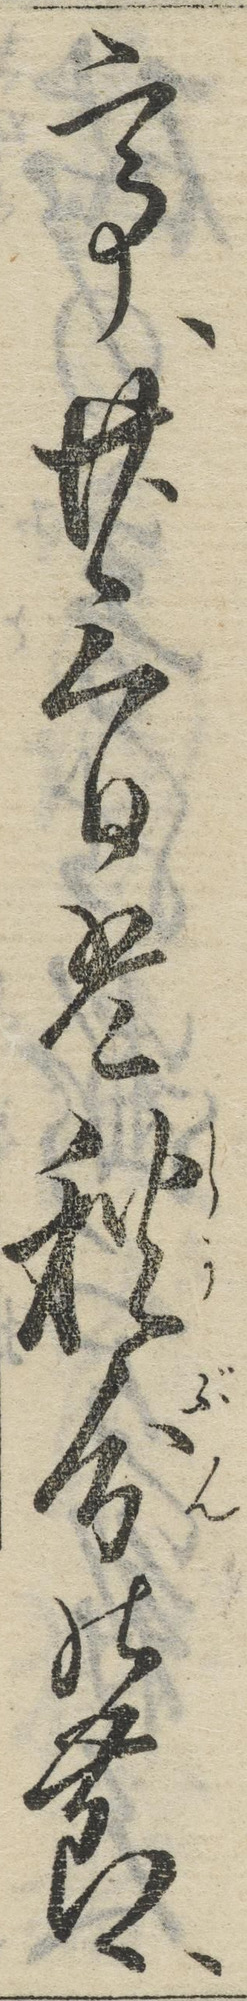て、廿三日は秋分の節、
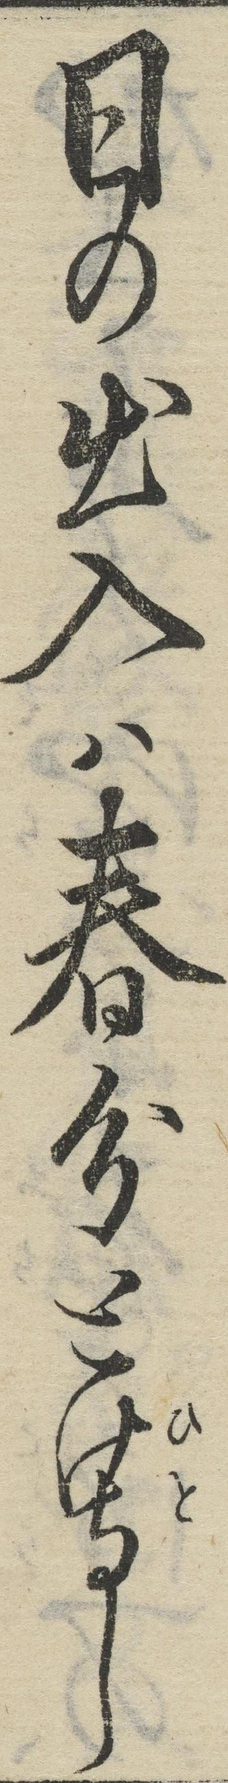日の出入は春分と等し
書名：暦日往来　單
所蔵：東京大学地震研究所図書室 Earthquake Research Institute Library, The University of Tokyo, JAPAN
